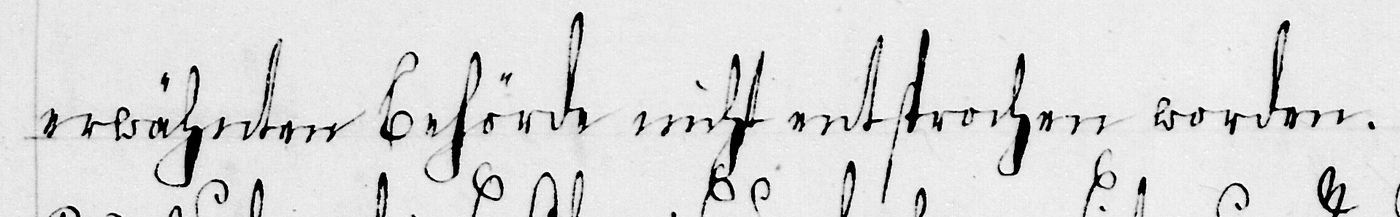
erwähnten Behörde nicht entsprochen worden.
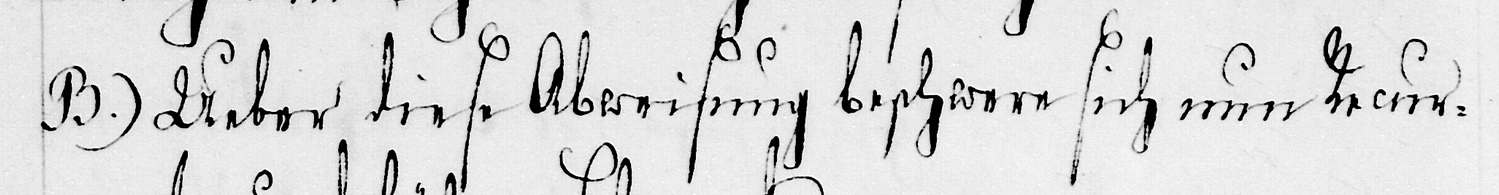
B.) Ueber diese Abweisung beschwere sich nun Recur¬
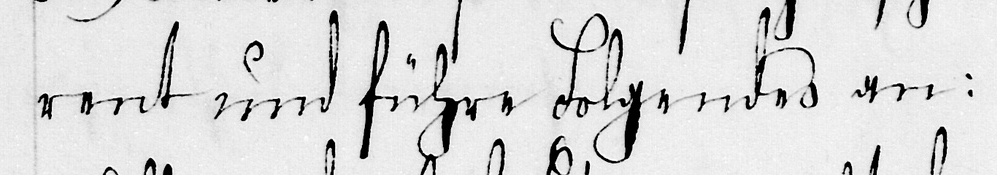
rent und führe Folgendes an:
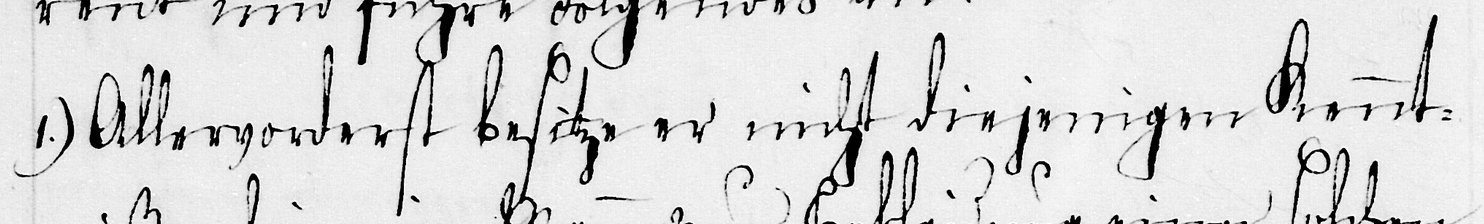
Allervorderst besitze er nicht diejenigen Kennt¬
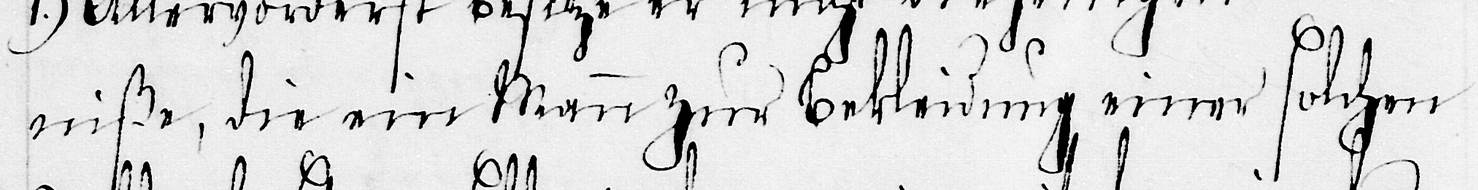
niße, die ein Mann zur Bekleidung einer solchen
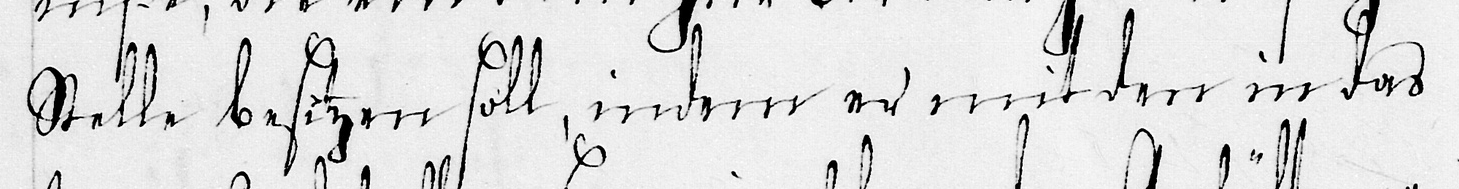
Stelle besitzen soll, indem er mit den in das
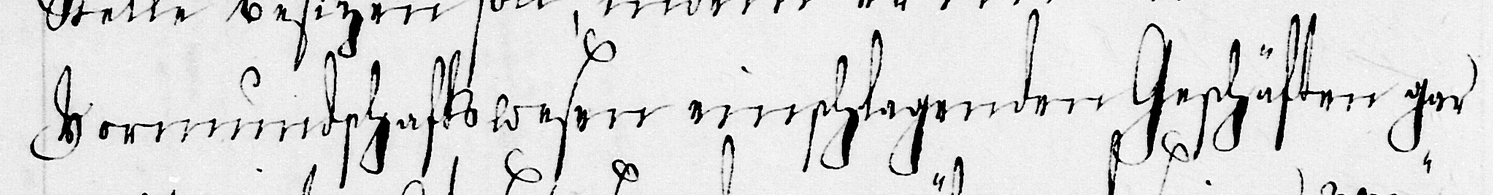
Vormundschaftswesen einschlagenden Geschäften gar
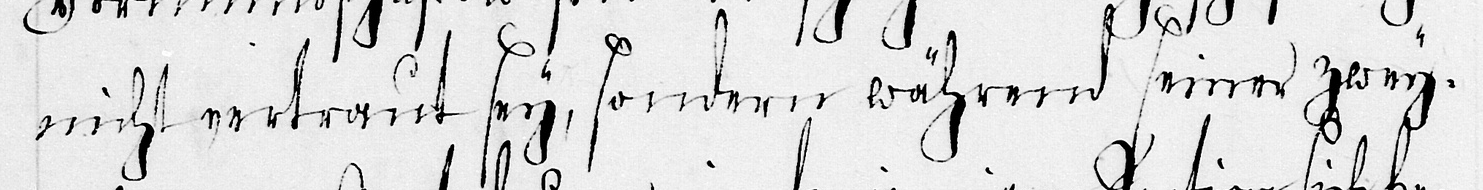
nicht vertraut sey, sondern während seiner zwey¬
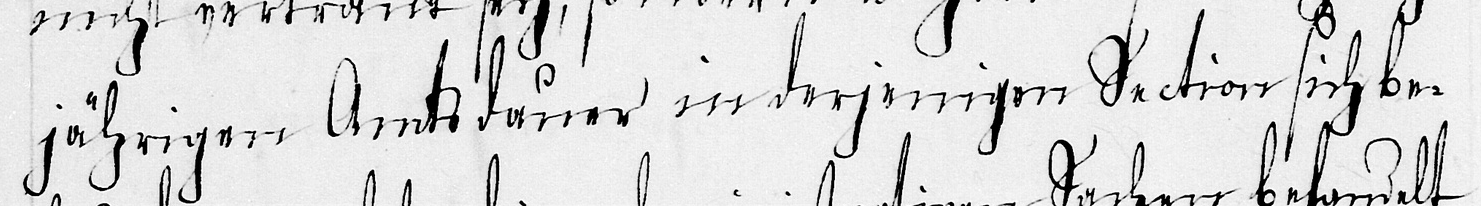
jährigen Amtsdauer in derjenigen Section sich be¬
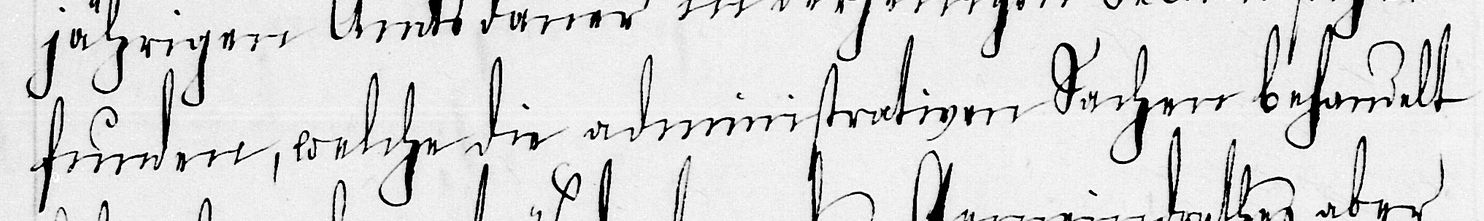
funden, welche die administrativen Sachen behandelt
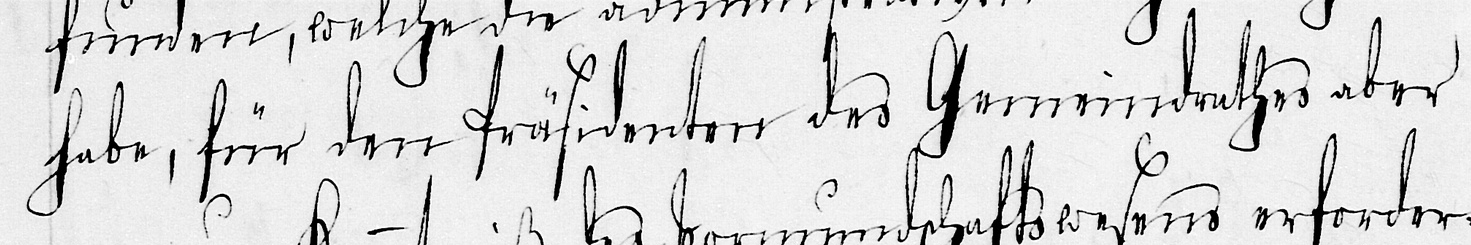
habe, für den Präsidenten des Gemeindrathes aber
